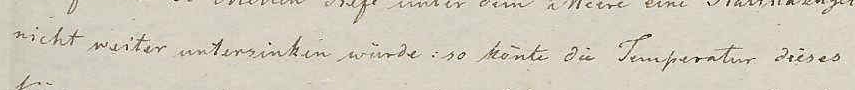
nicht weiter untersinken würde: so könte die Temperatur dieses
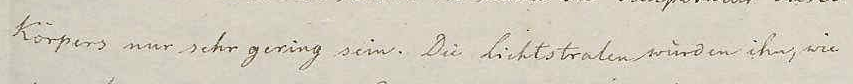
Körpers nur sehr gering sein. Die Lichtstralen würden ihn, wie
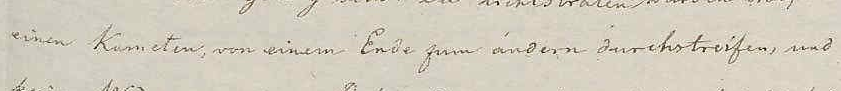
einen Kometen, von einem Ende zum andern durchstreifen, und
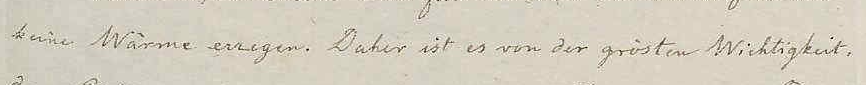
keine Wärme erregen. Daher ist es von der grösten Wichtigkeit,
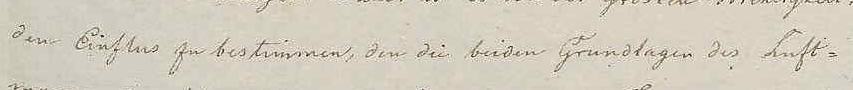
den Einflus zu bestimmen, den die beiden Grundlagen des Luft-
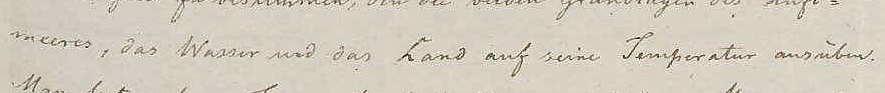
meeres, das Wasser und das Land auf seine Temperatur ausüben.
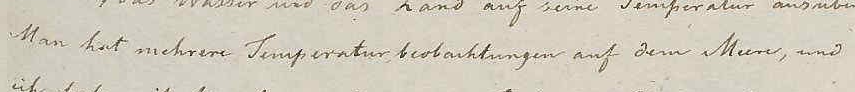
Man hat mehrere Temperaturbeobachtungen auf dem Meere, und
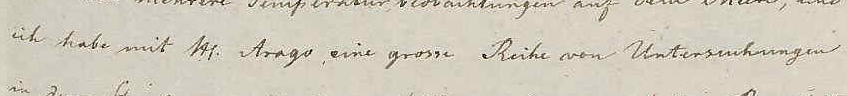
ich habe mit H￼. Arago eine grosse Reihe von Untersuchungen
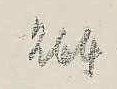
Resultat
